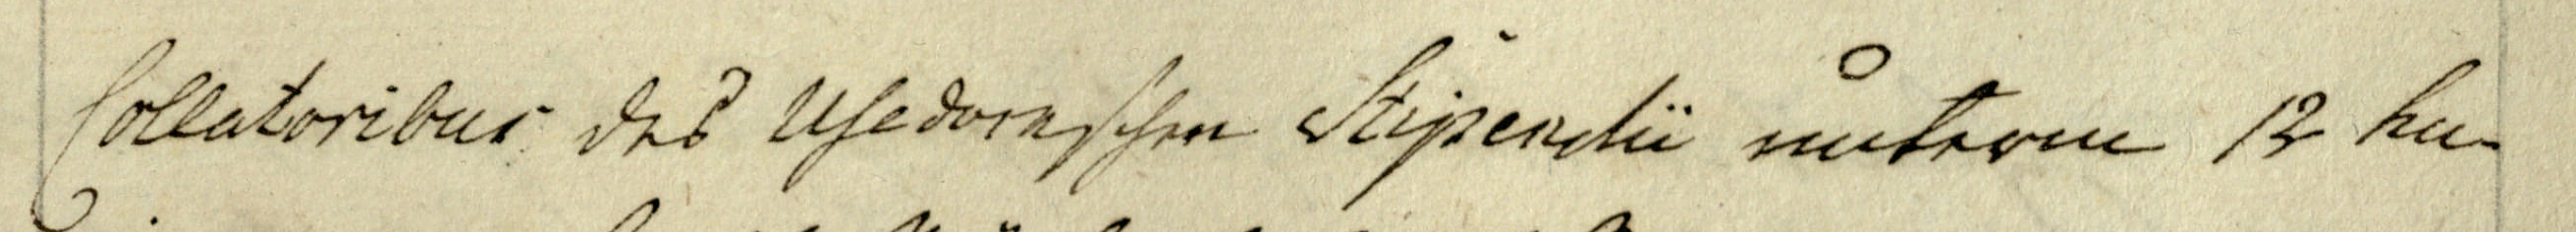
Collatoribus des Usedomschen Stipendii unterm 12 hu¬
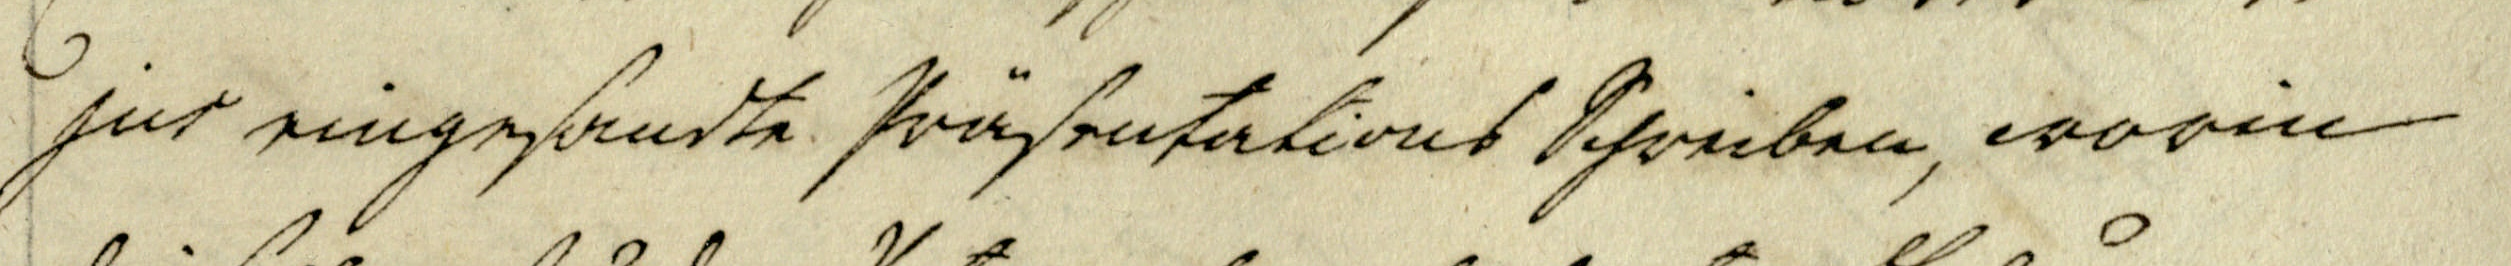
jus eingesandte Präsentations Schreiben, worin
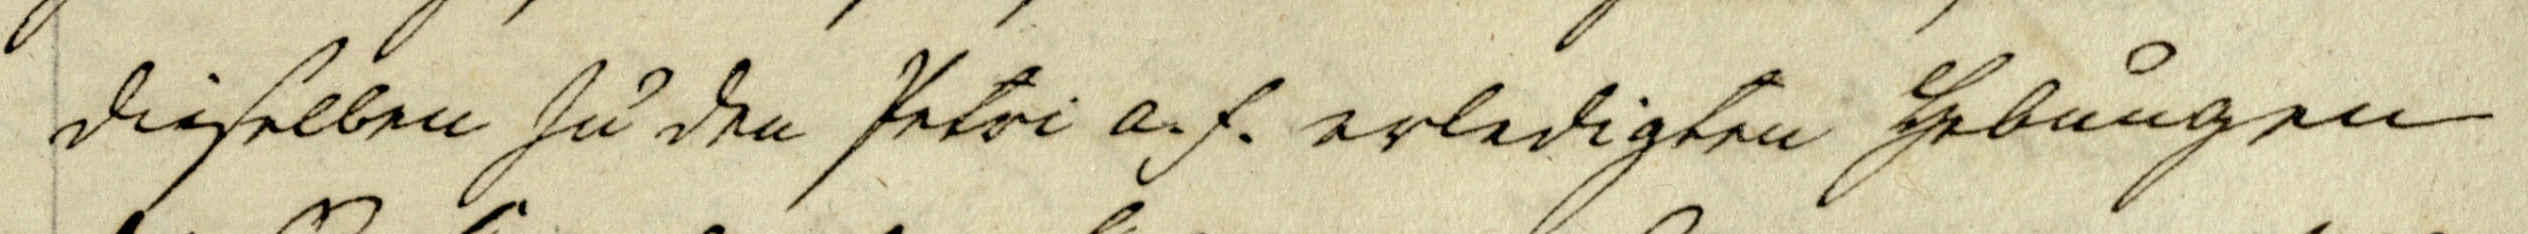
dieselben zu den Petri a. f. erledigten Hebungen
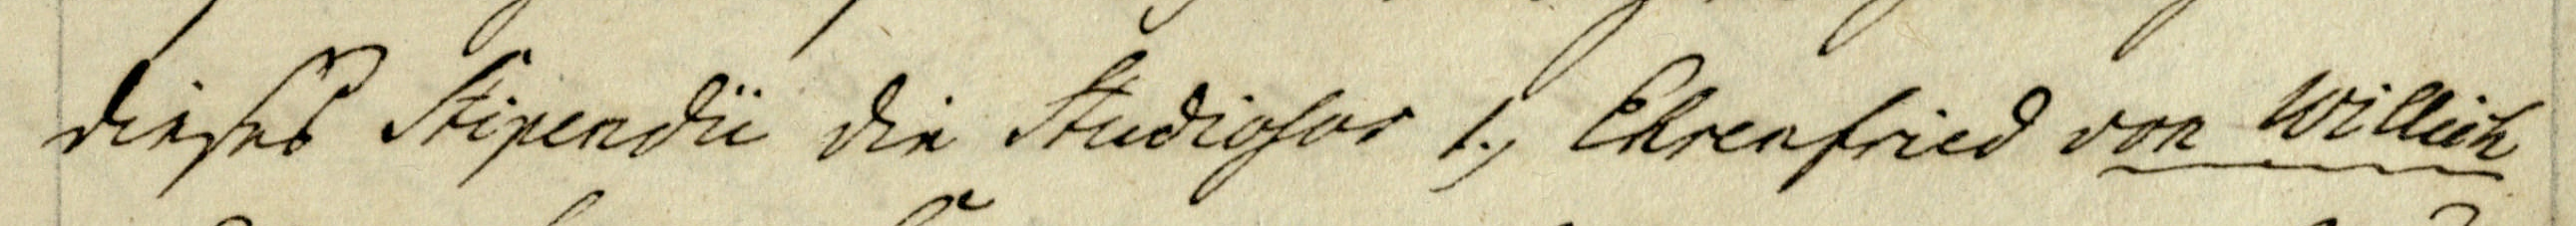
dieses Stipendii die Studiosos 1., Ehrenfried von Willich
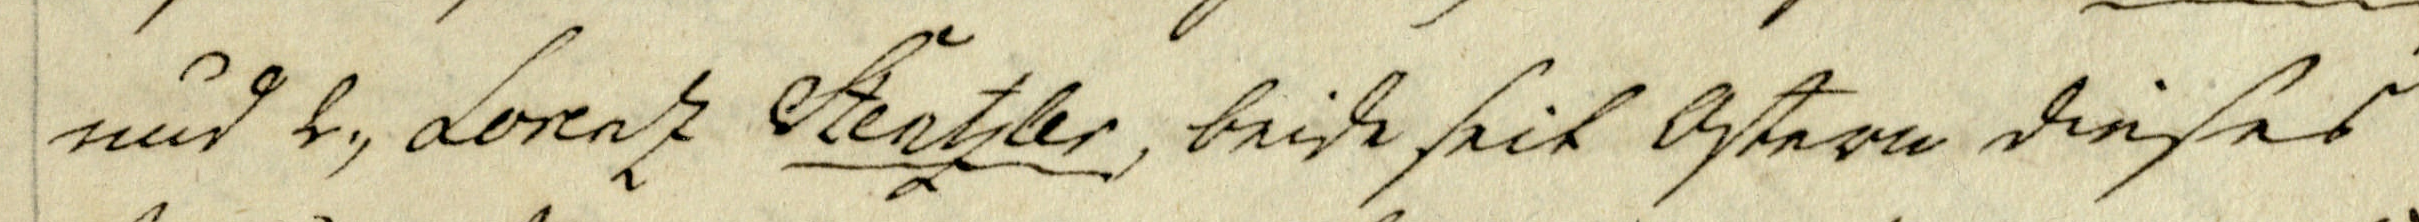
und 2., Lorenz Stentzler, beide seit Ostern dieses
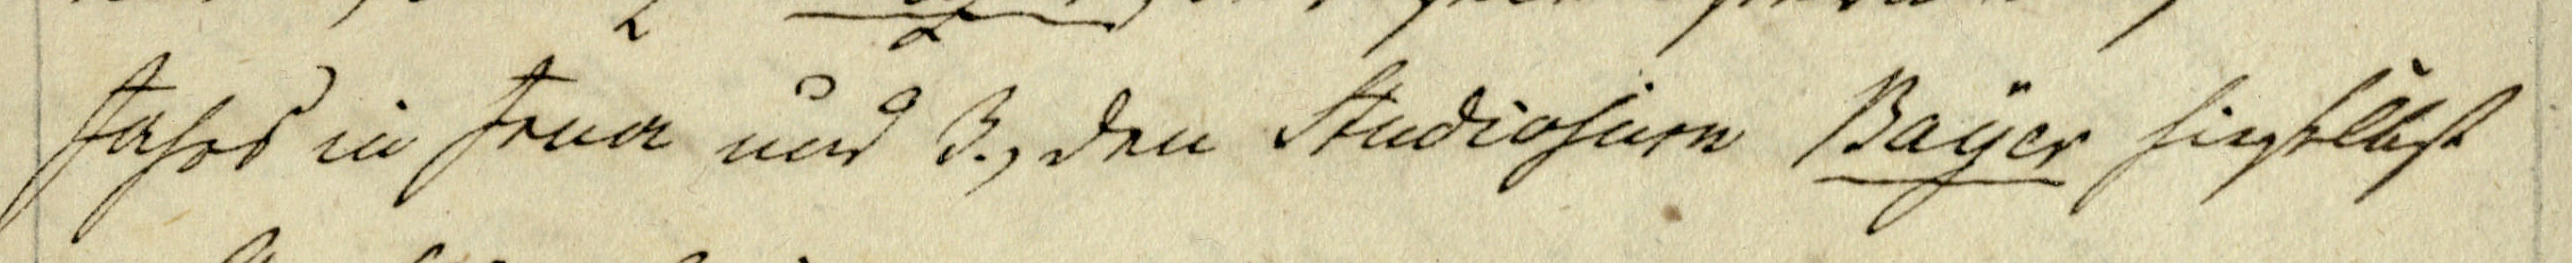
Jahes in Jena und 3., den Studiosum Baÿer hieselbst
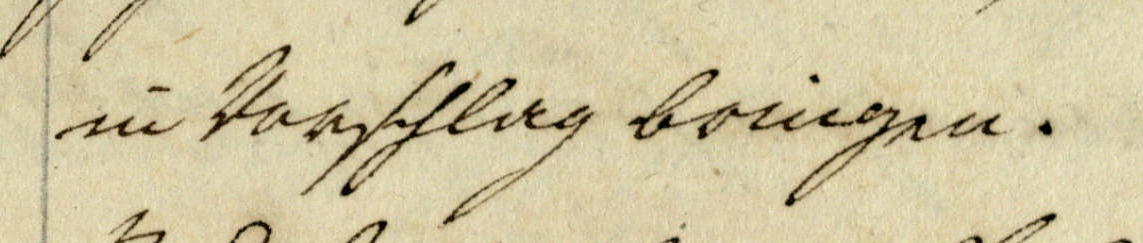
in Vorschlag bringen.
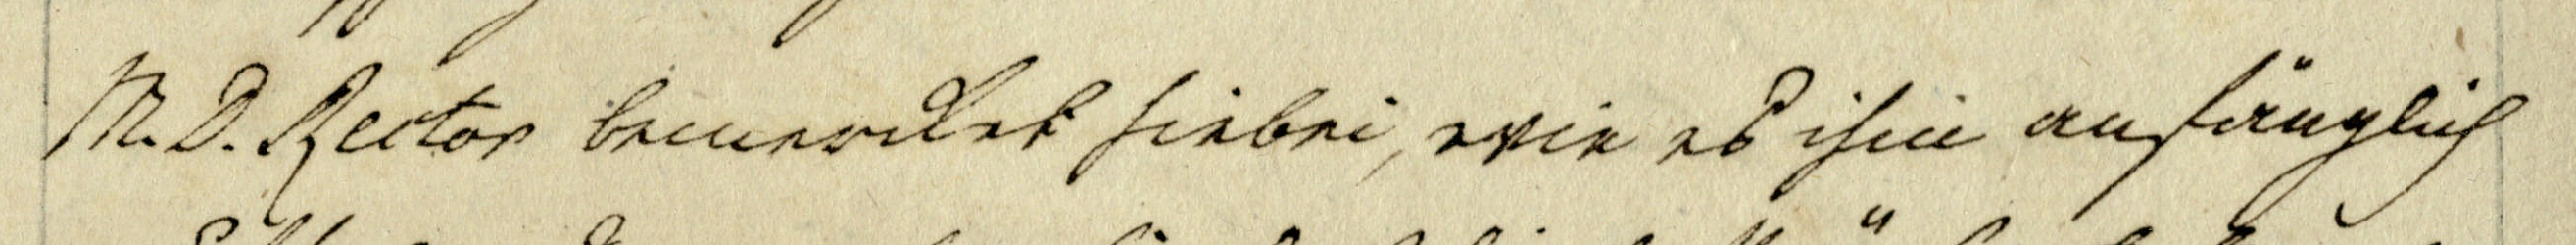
M. D. Rector bemercket hiebei, die es ihm anfänglich
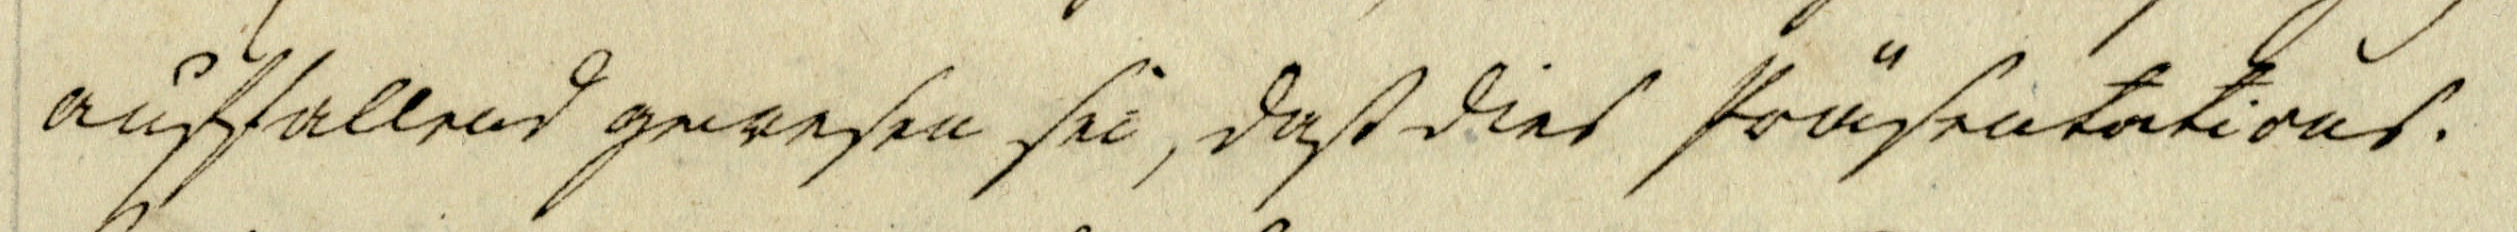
auffallend gewesen sei, daß dies Präsentations¬
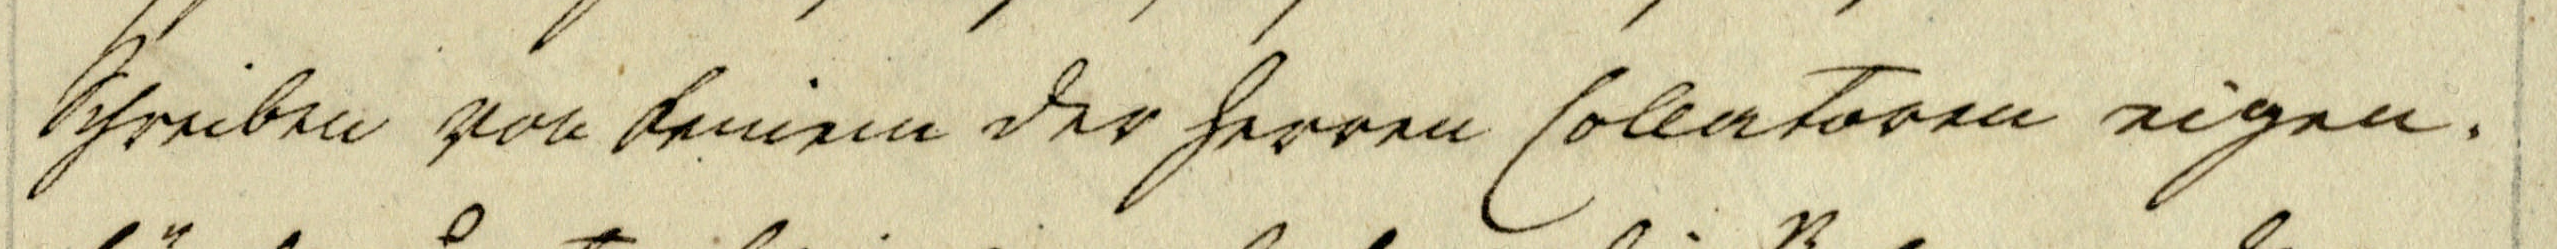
Schreiben von keinem der Herren Collatoren eigen¬
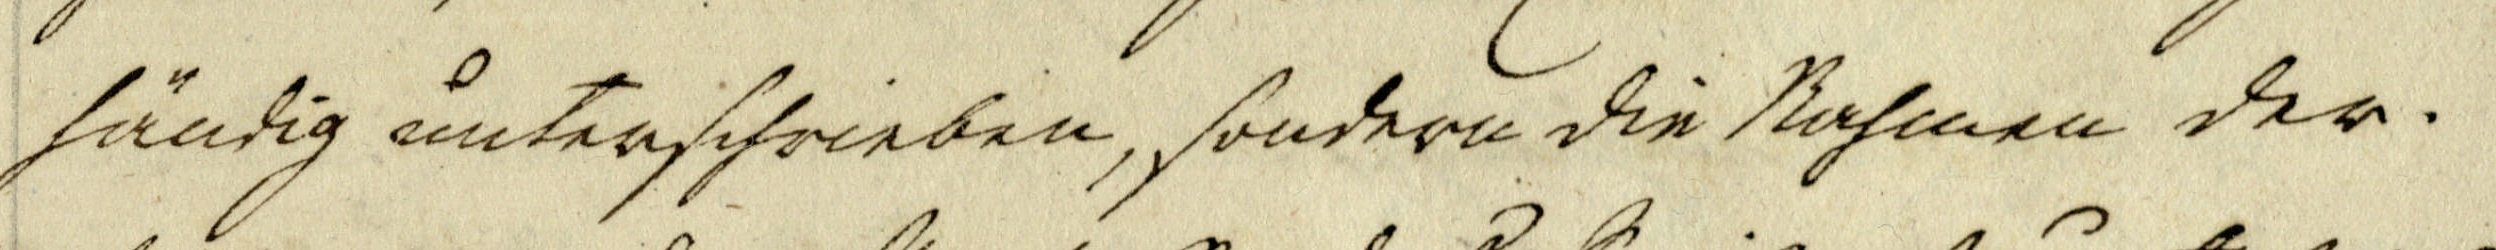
händig unterschrieben, sondern die Nahmen der¬
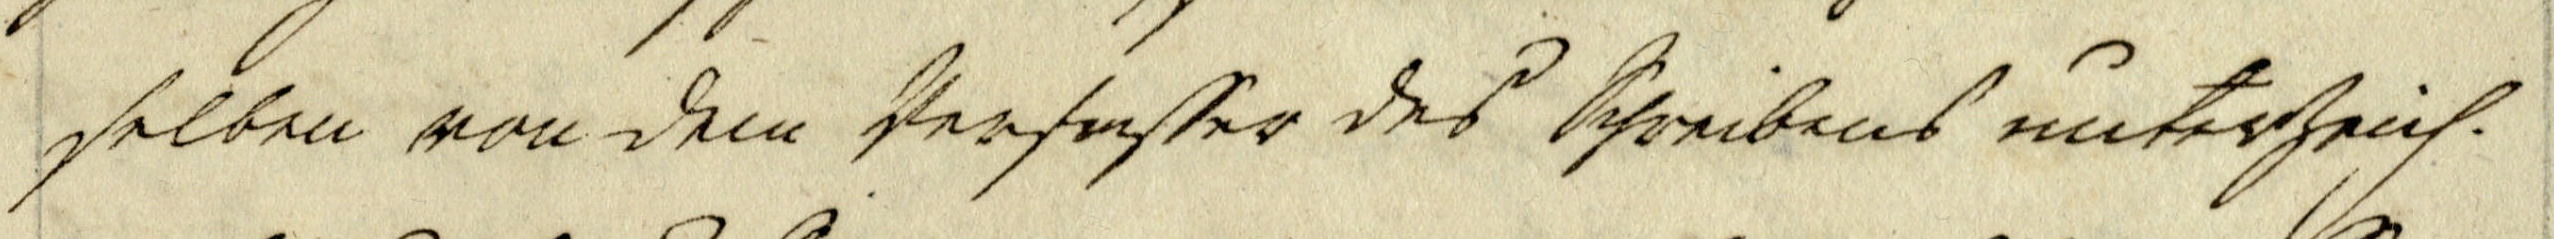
selben von dem Verfasser des Schreibens unterzeich¬
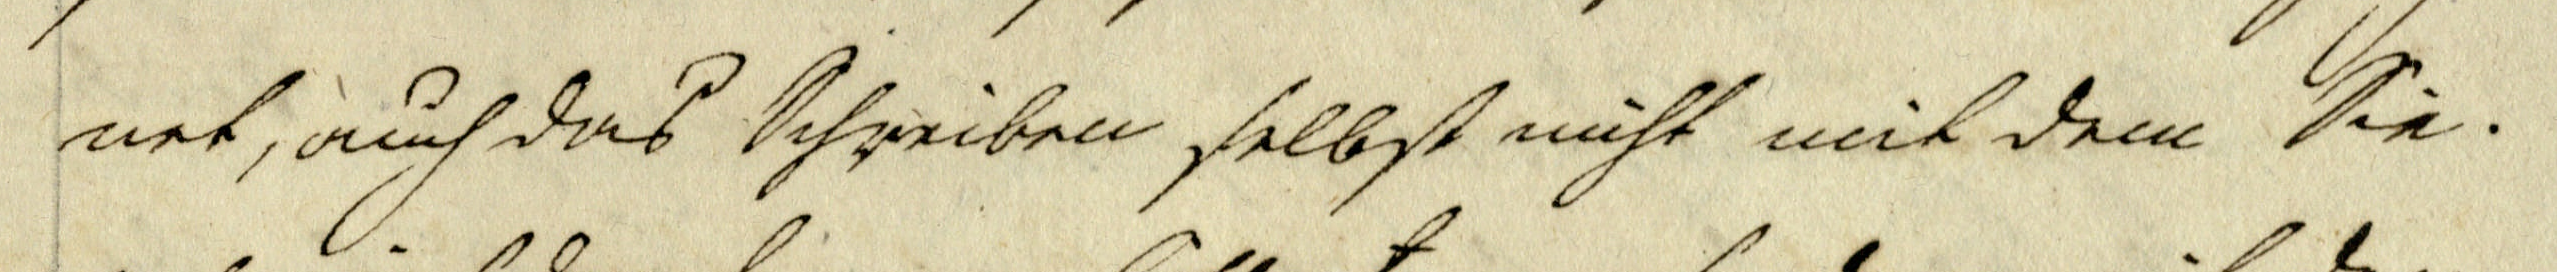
net, auch das Schreiben selbst nicht mit dem Sie¬
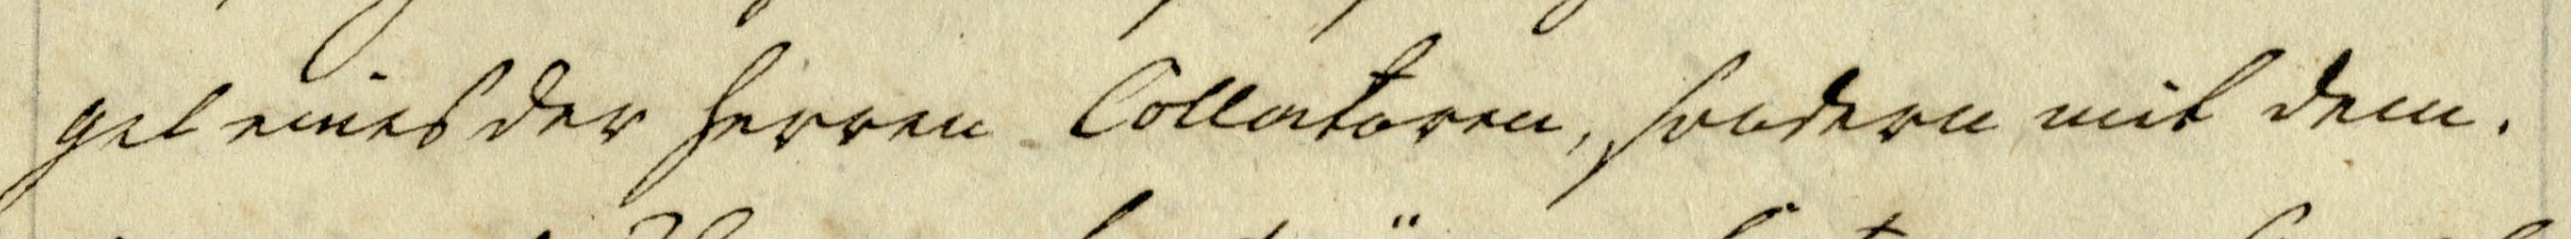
gel eines der Herren Collatoren, sondern mit dem¬
